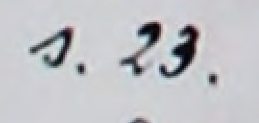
s. 23.
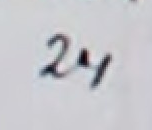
24
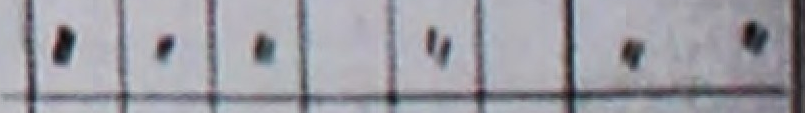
„ „ „ „ „ „
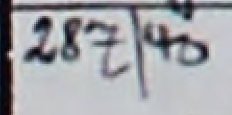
287/40
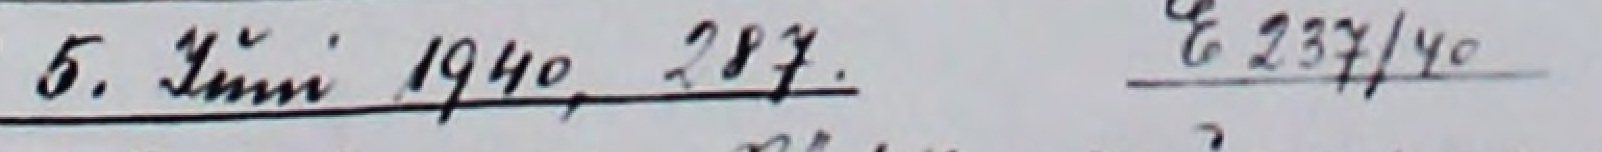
5. Juni 1940, 287. E 237/40
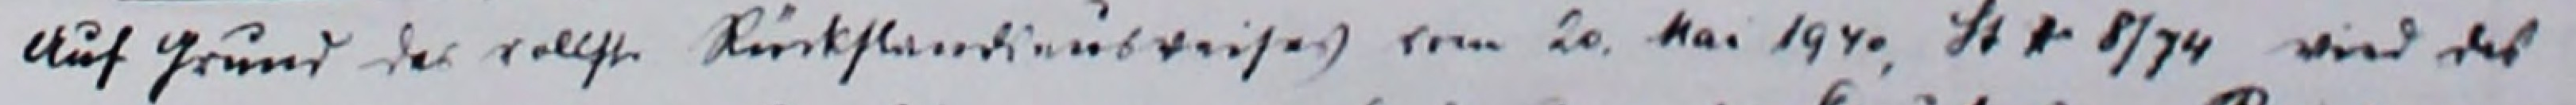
Auf Grund des vollstr. Rückstandsausweises vom 20. Mai 1940, St ? 8/74 wird das
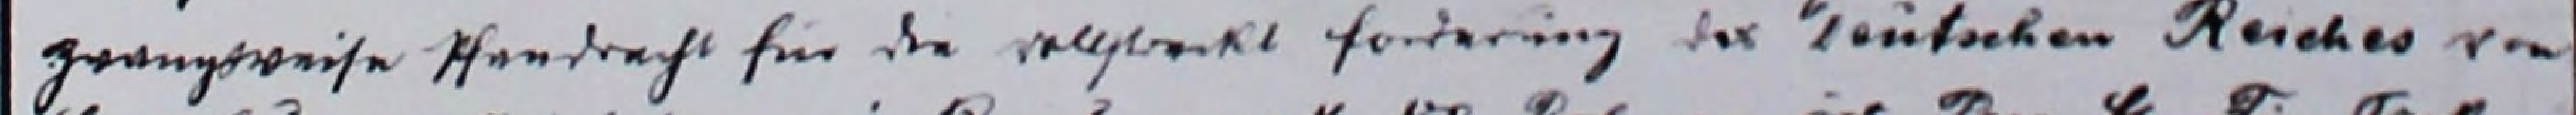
Zwangsweise Pfandrecht für die vollstreckt Forderung der Deutschen Reiches von
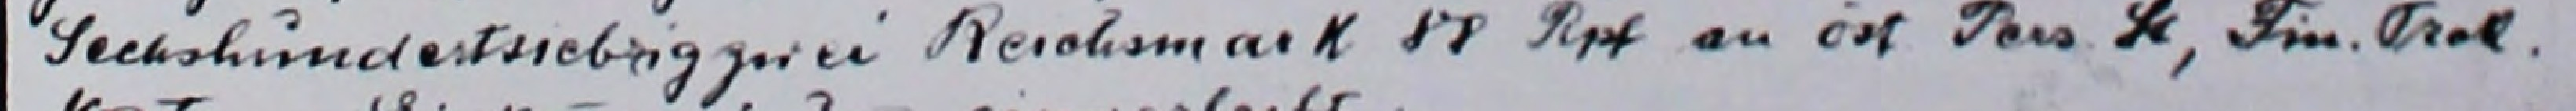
Sechshundertsiebzigzwei Reichsmark 88 Rpf an öst. Pers St, Fin.
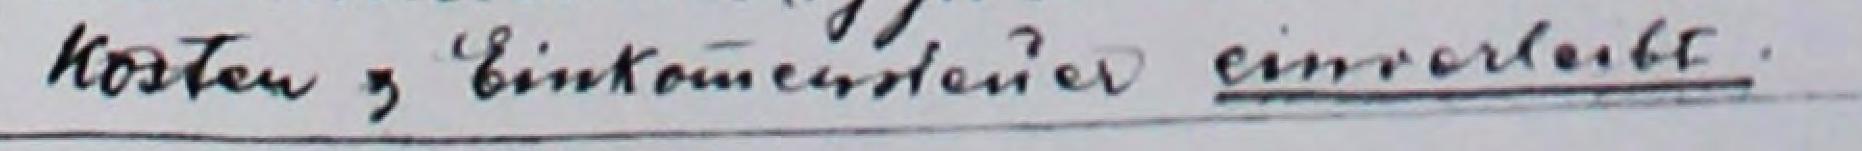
Trok. Kosten 3 Einkommensteuer einverleibt.
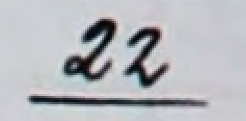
22
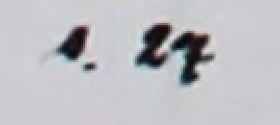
s. 27
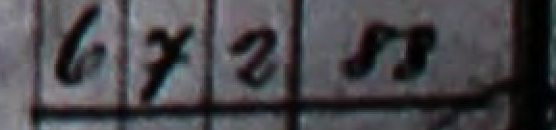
67288
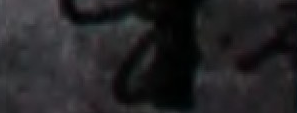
??
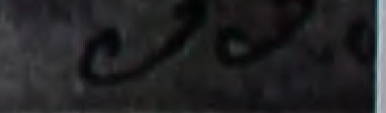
35.
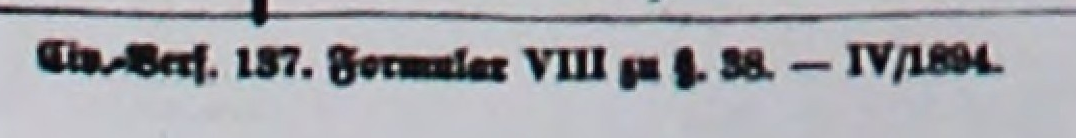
Ein=Vers. 137. Formular VIII zu ?. 38. - IV/1894.
